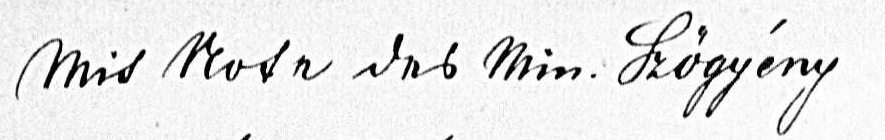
Mit Note des Min. Szögyény
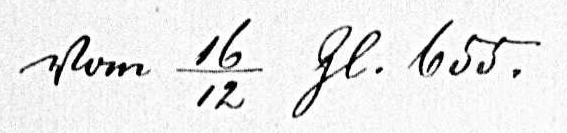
vom 16/12 Zl. 655
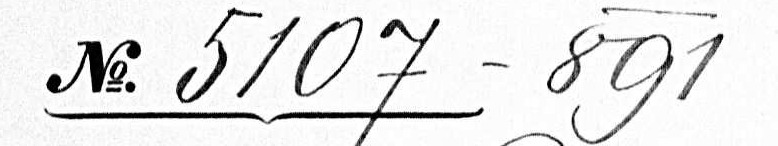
No. 5107 – 1891
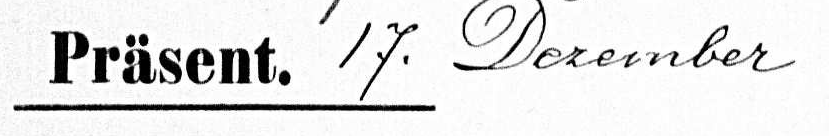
Präsent. 17. Dezember
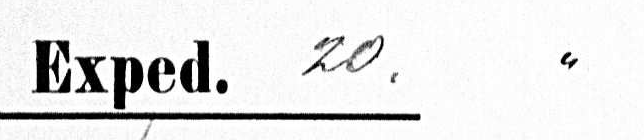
Expedit 20. „
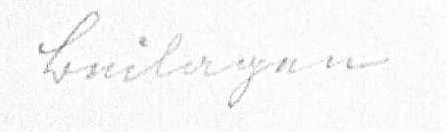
Beilagen
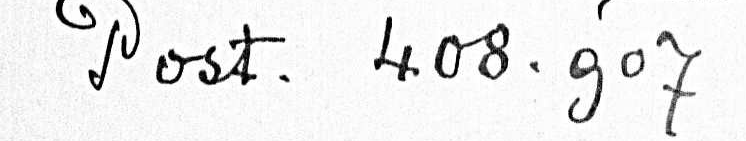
Post 408. 1907
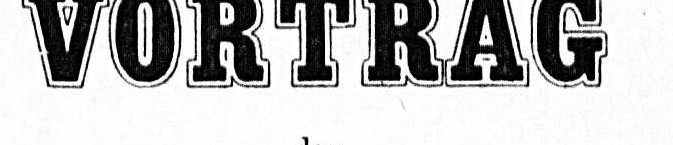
VORTRAG
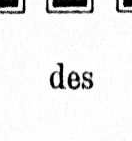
Des
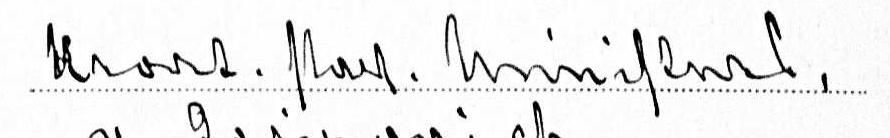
kroat. slav. Ministers
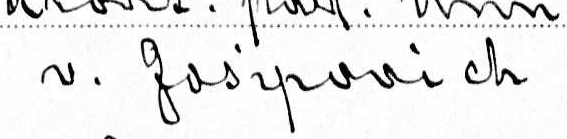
v. Josipovich
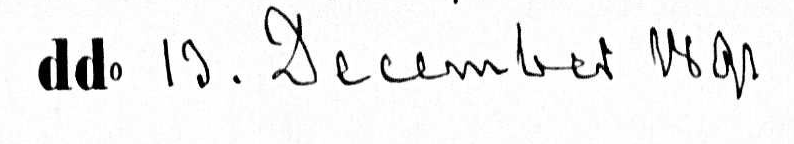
Ddo 13. December 1891
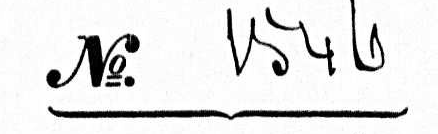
No. 1546
